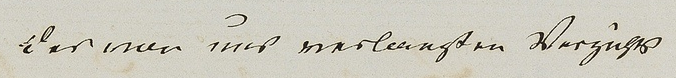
des von uns verlangten Verzichts
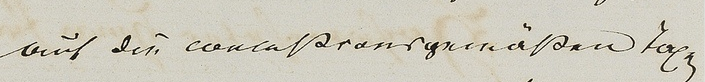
auf die conceßionsgemäßen Taxen
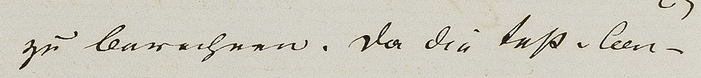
zu berechnen. Da die teß. Con-
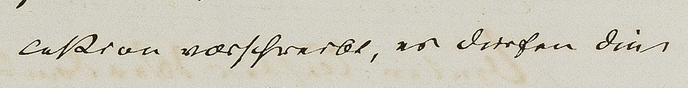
ceßion vorschreibt, es dürfen die
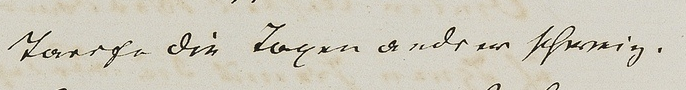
Tarife die Taxen andrer schweiz.
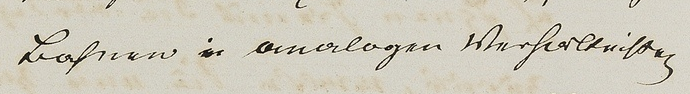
Bahnen in analogen Verhältnißen
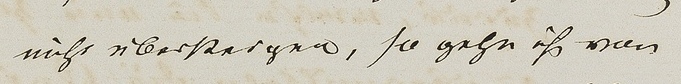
nicht übersteigen, so gehe ich von
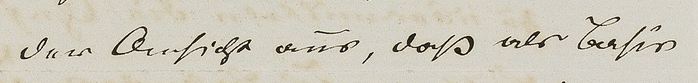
der Ansicht aus, daß als Basis
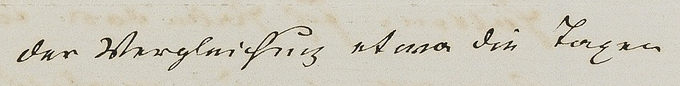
der Vergleichung etwa die Taxen
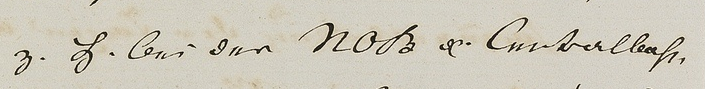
z. H. bei der NOB. & Centralbahn
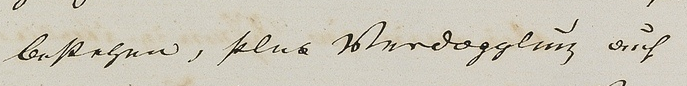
bestehen, plus Verdopplung auf
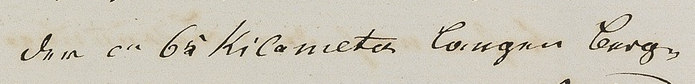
der ca 65 Kilometer langen Berg-
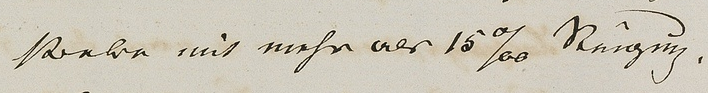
streke mit mehr als 15‰ Steigung.
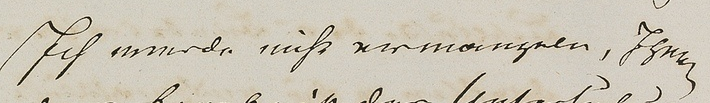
Ich werde nicht ermangeln, Ihnen
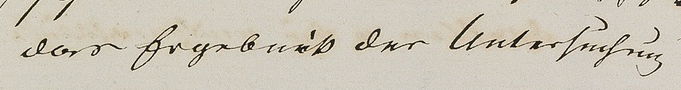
das Ergebniß der Untersuchung
